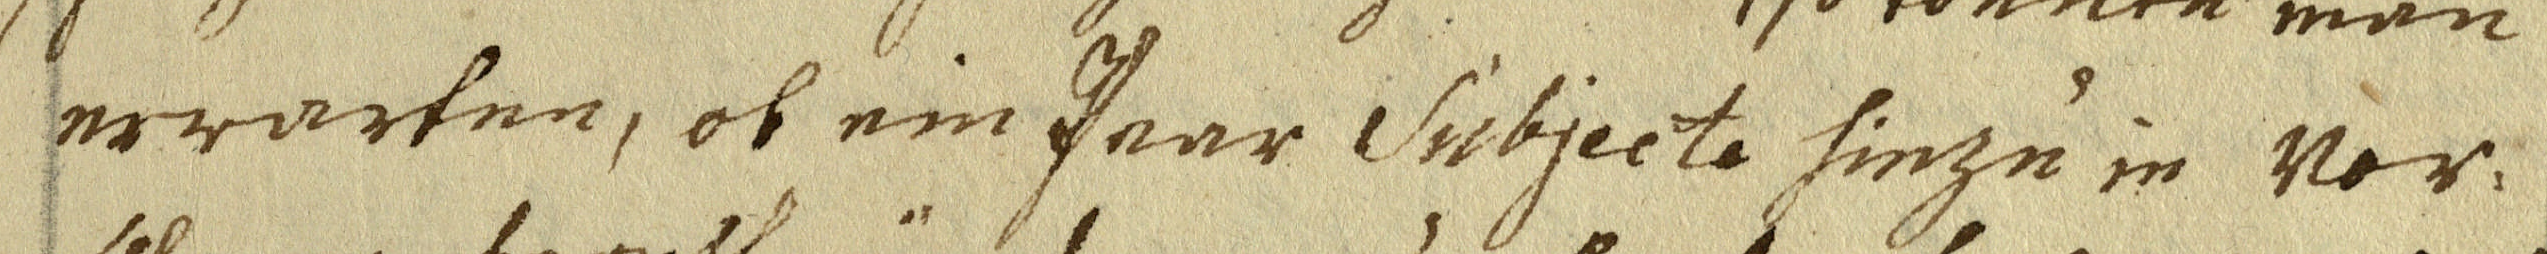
erwarten, ob ein Paar Subjecte hiezu in vor¬
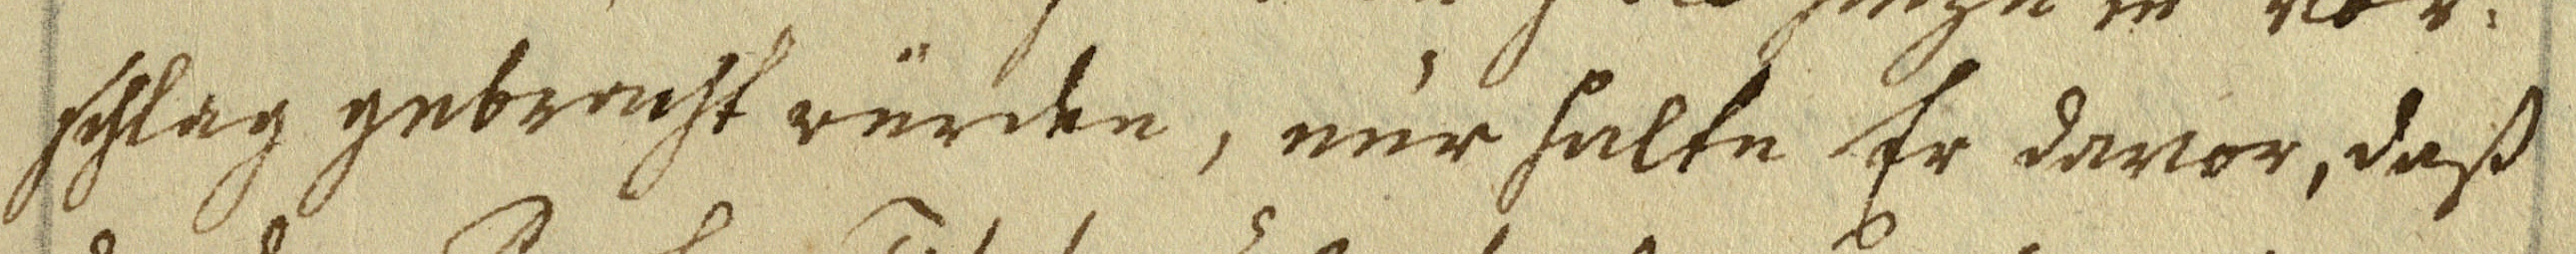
schlag gebracht würden, nur halte Er davor, daß
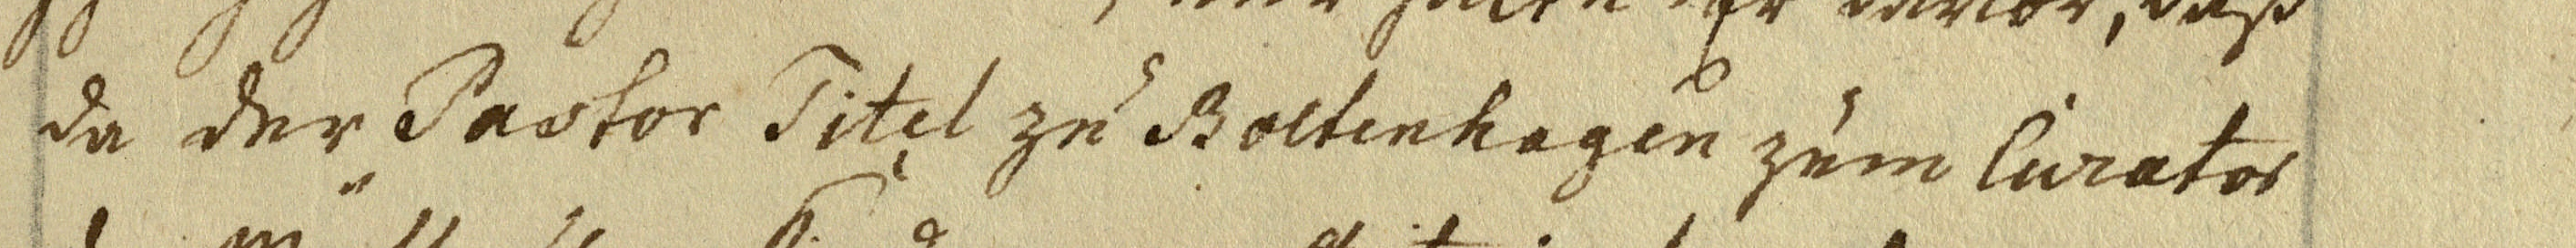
da der Pastor Titel zu Boltenhagen zum Curator
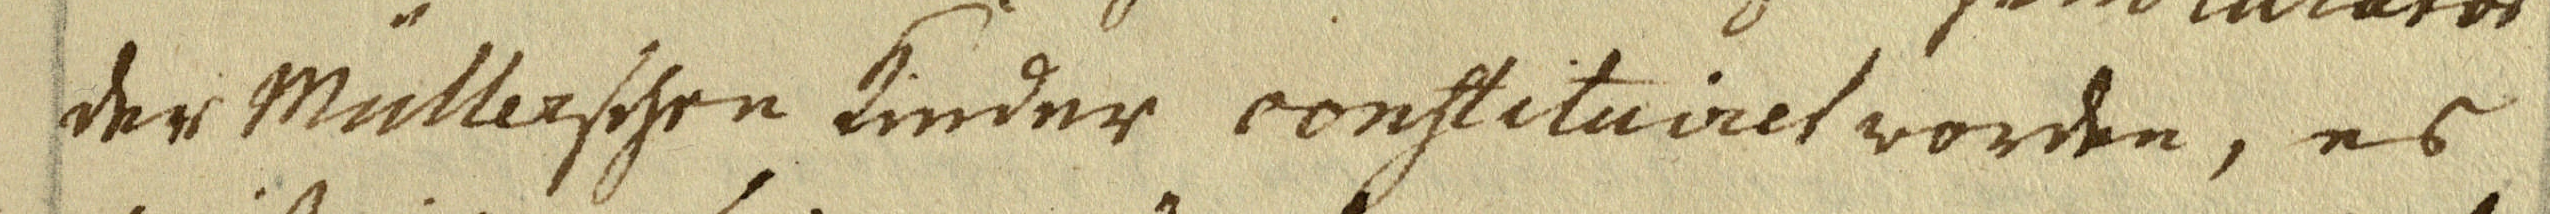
der Müllerschen Kinder constituiret worden, es
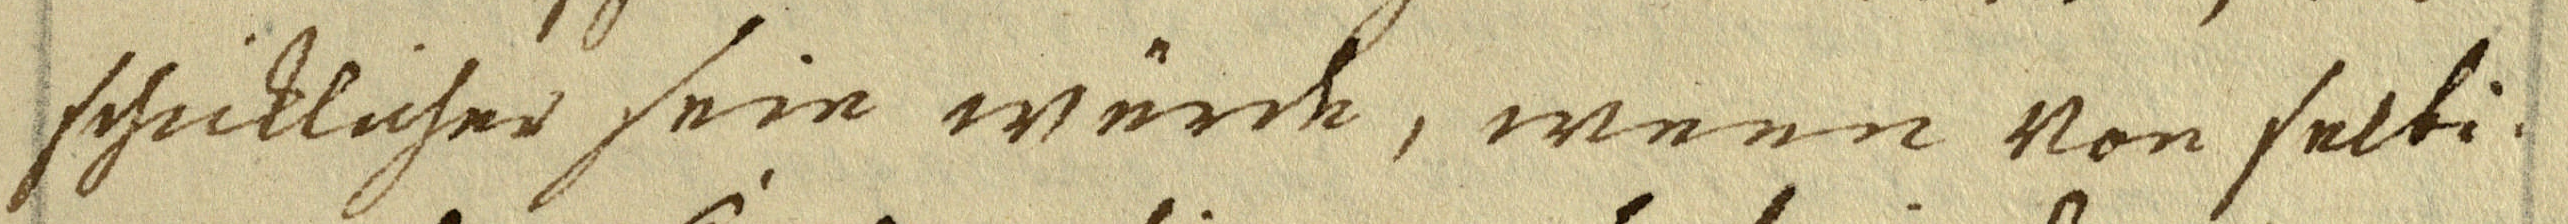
schicklicher sein würde, wenn von selbi¬
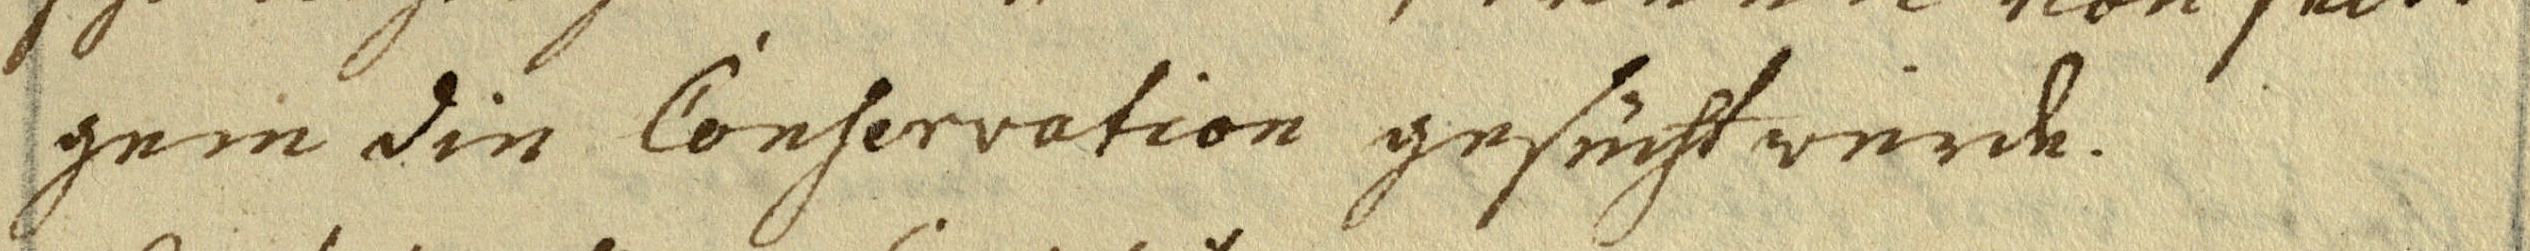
gem die Conservation gesucht würde.
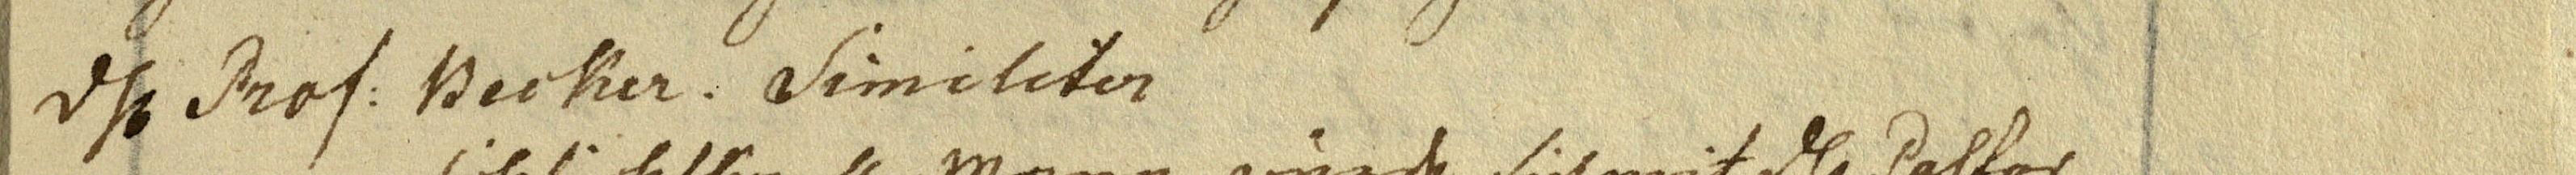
dh Prof: Becker . Similiter
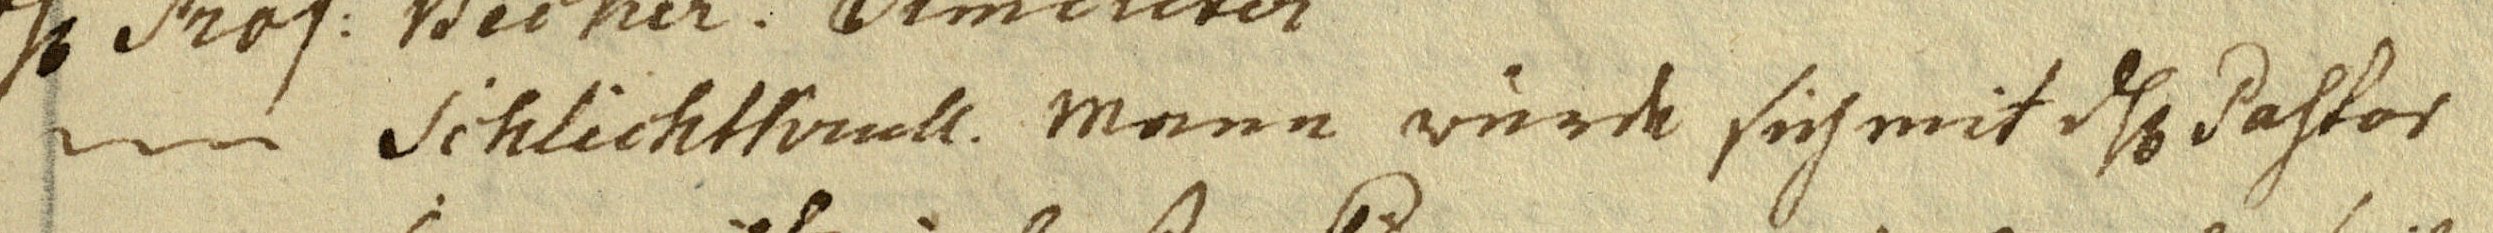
Schlichtkrull. Mann würde sich mit dh Pastor
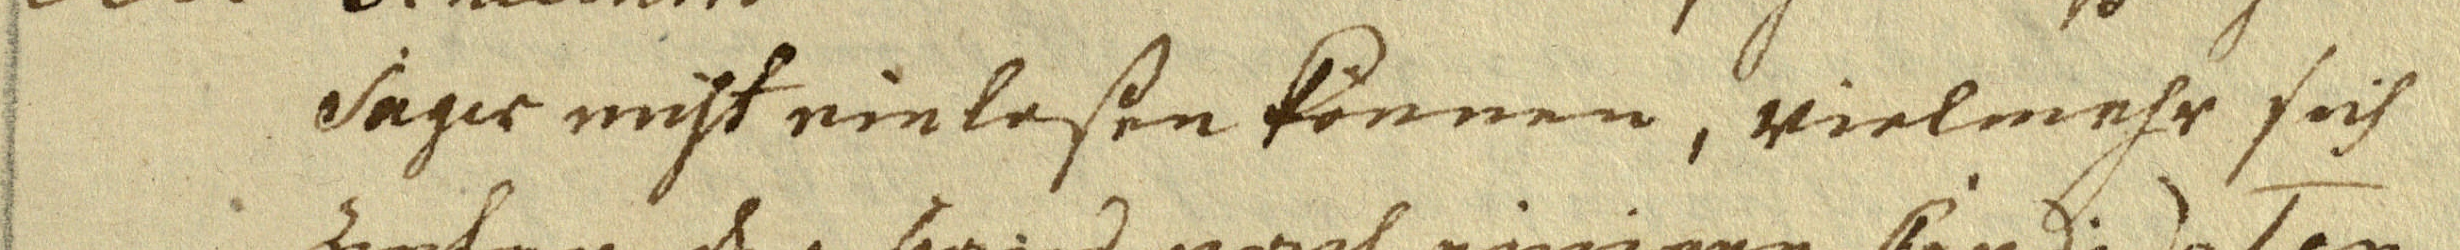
Sager nicht einlaßen können, vielmehr sich
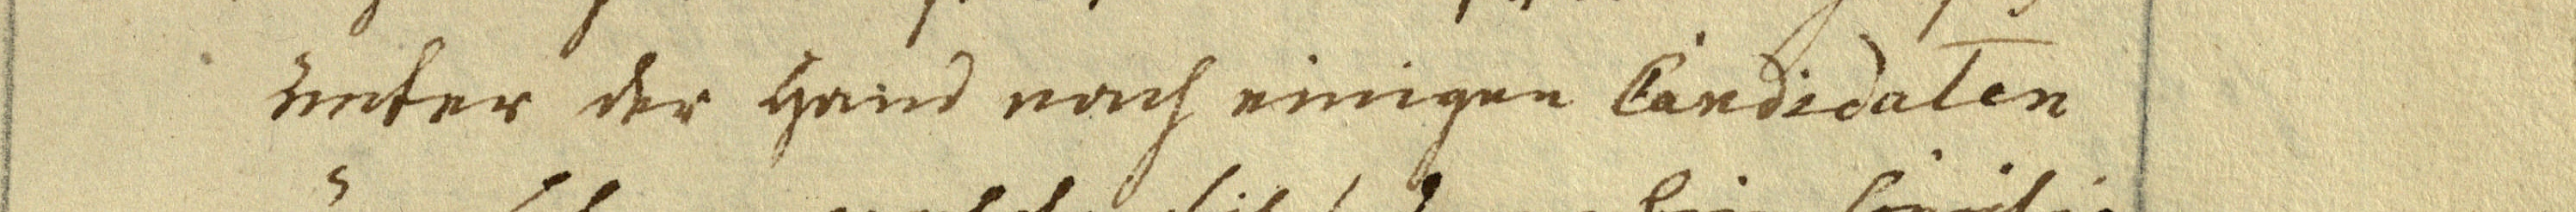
unter der Hand nach einigen Candidaten
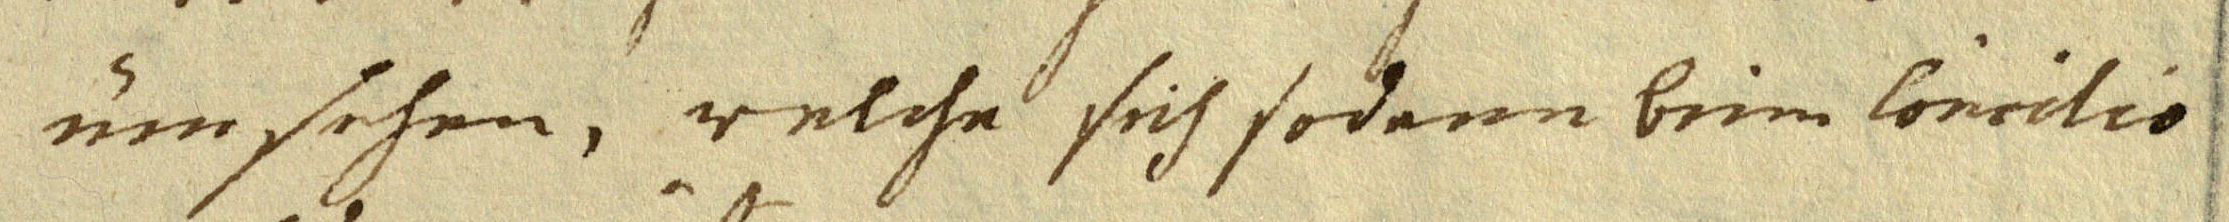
umsehen, welche sich sodann beim Concilio
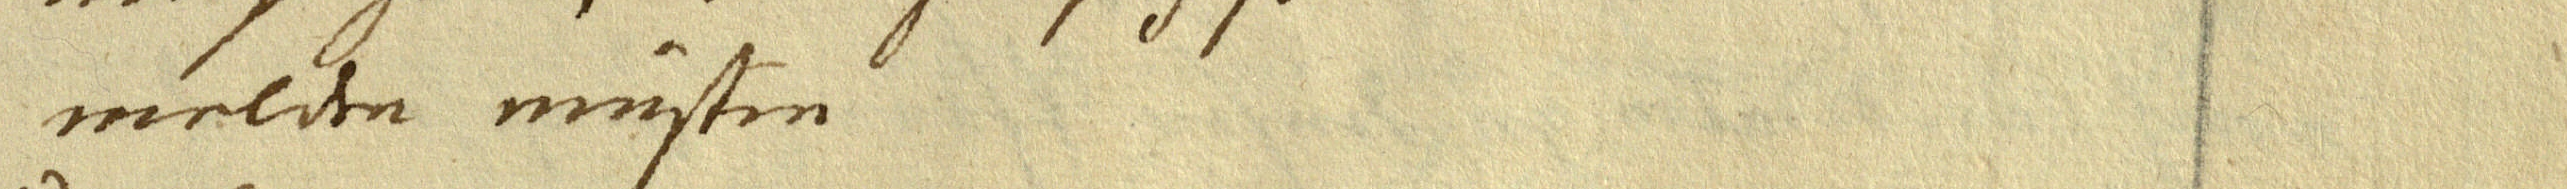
melden müsten.
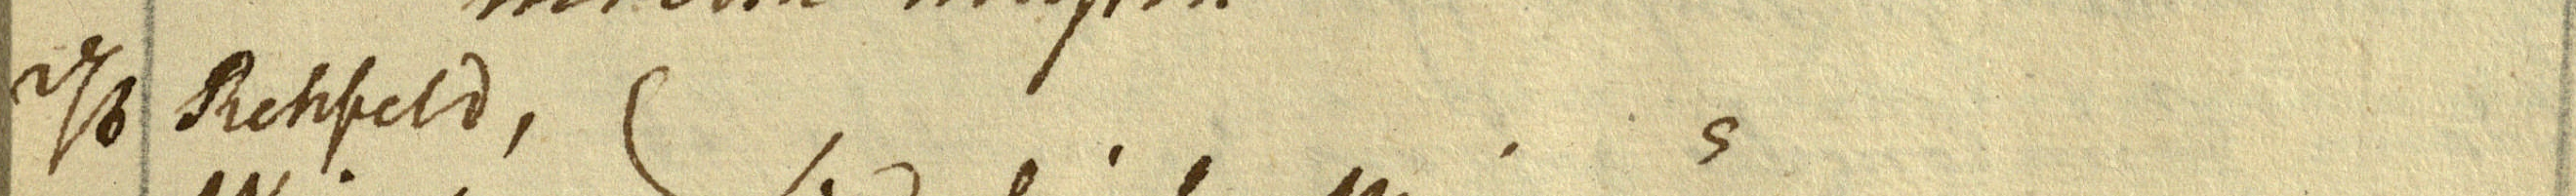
dh Rehfeld,
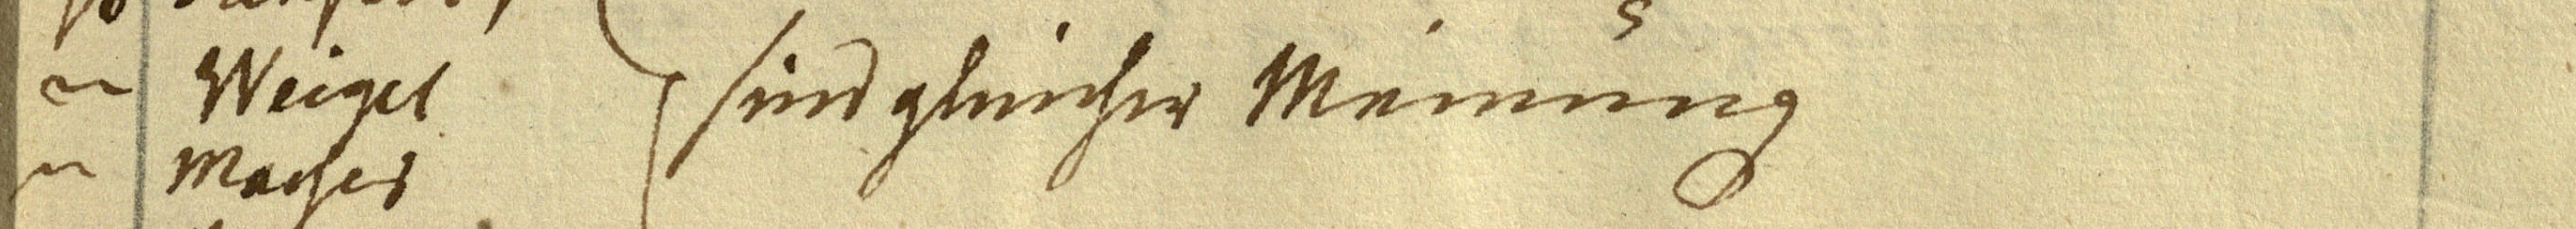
Weigel sind gleicher Meinung
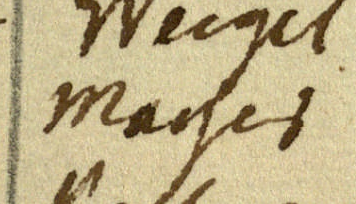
Mayer
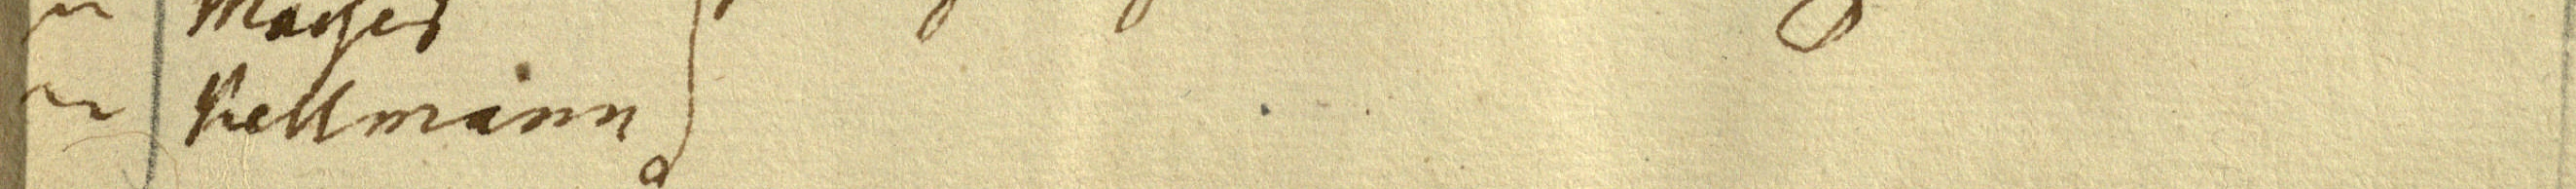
Kellmann
